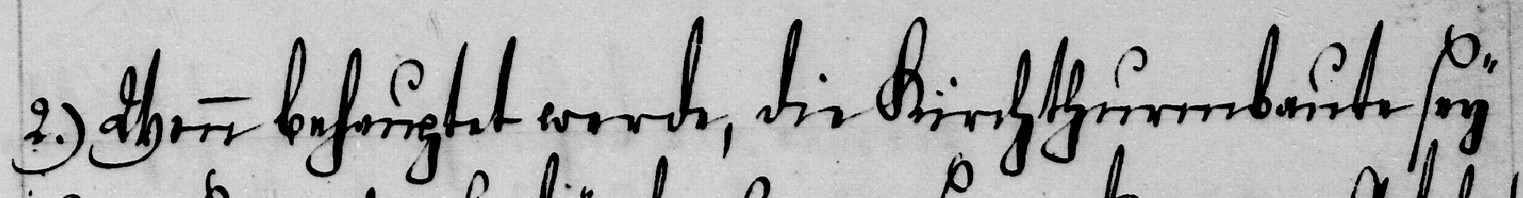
2.) Wenn behauptet werde, die Kirchthurmbaute sey
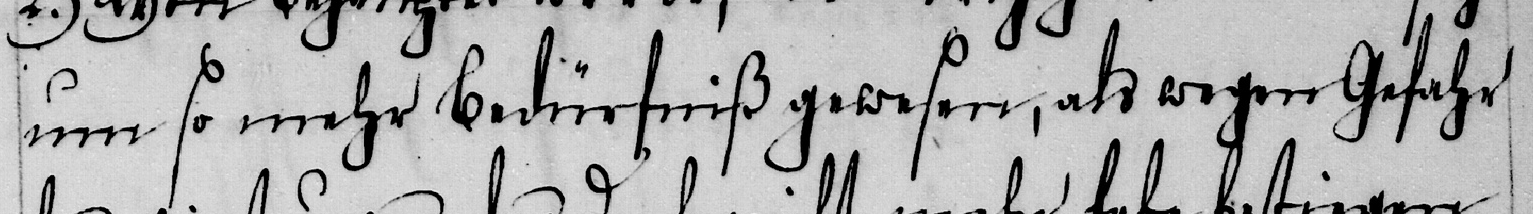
um so mehr Bedürfniß gewesen, als wegen Gefahr
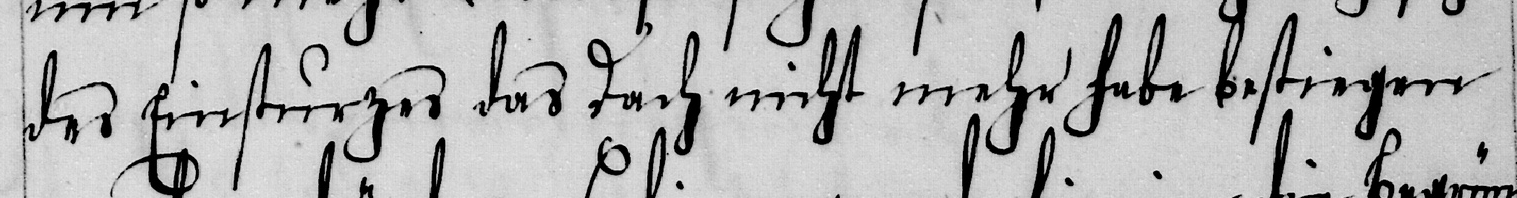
des Einsturzes das Dach nicht mehr habe bestiegen
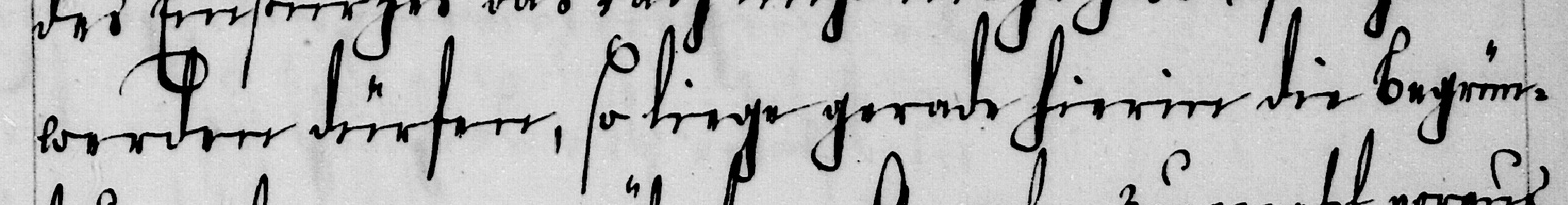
werden dürfen, so liege gerade hierin die Begrün¬
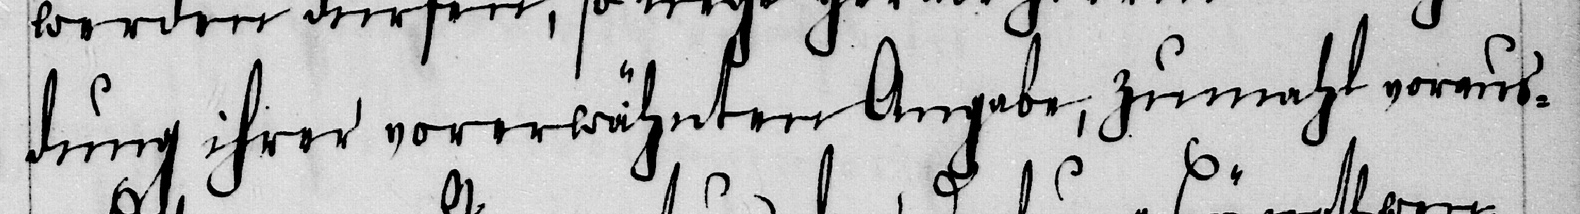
dung ihrer vorerwähnten Angabe, zumahl voraus¬
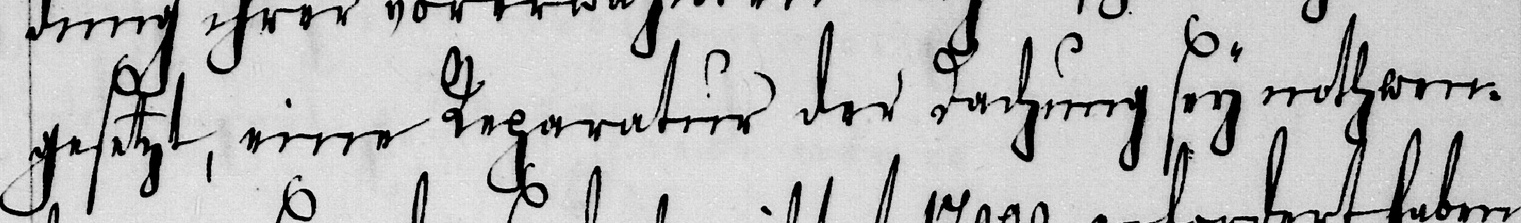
gesetzt, eine Reparatur der Dachung sey nothwen¬
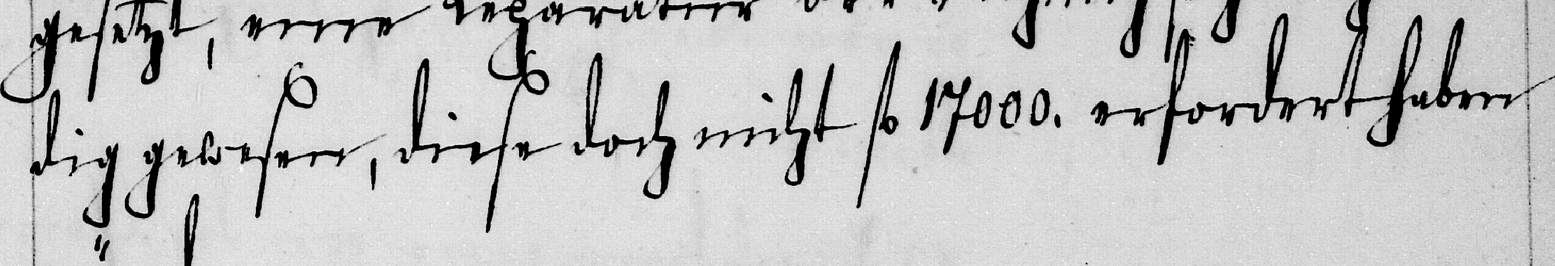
dig gewesen, diese doch nicht fl. 17000. erfordert haben
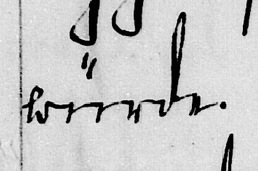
würde.
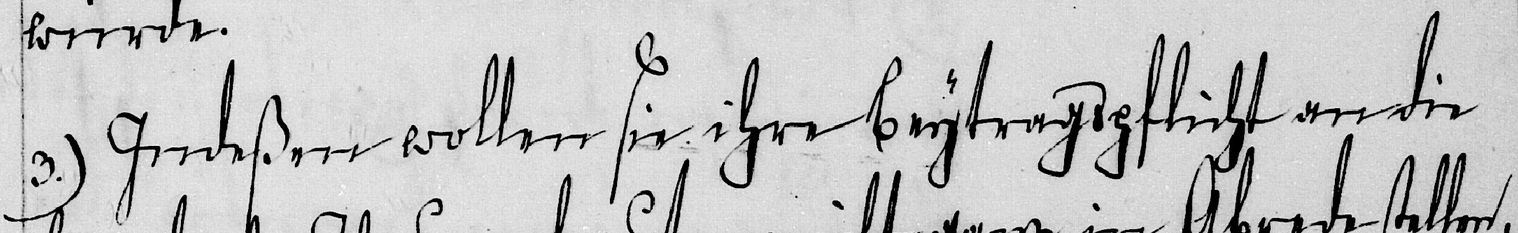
3.) Indeßen wollen sie ihre Beytragspflicht an die
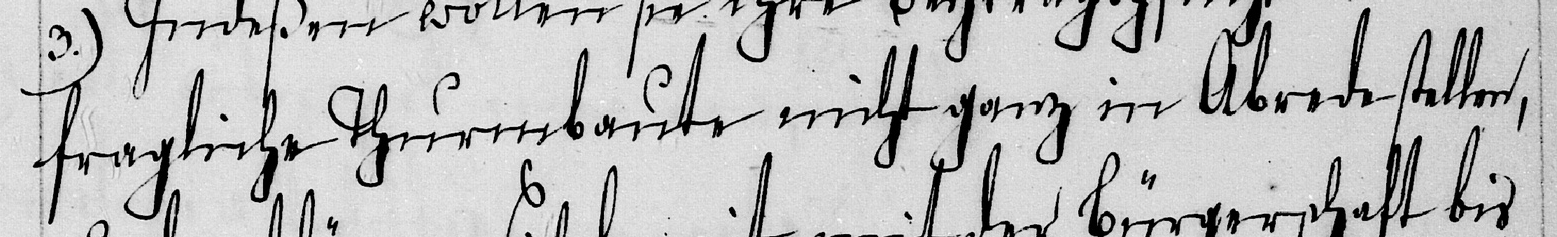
fragliche Thurmbaute nicht ganz in Abrede stelle¬
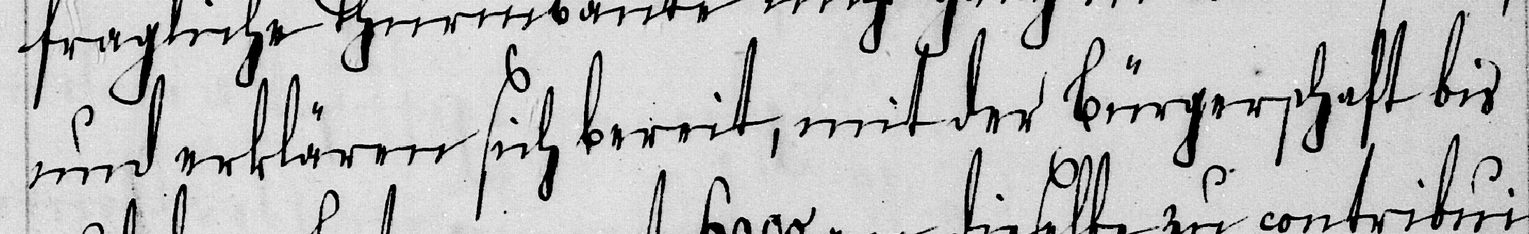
und erklären sich bereit, mit der Bürgerschaft bis
